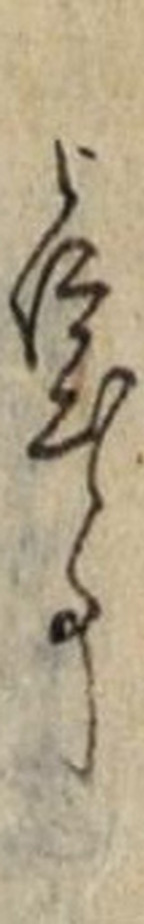被仰出候事
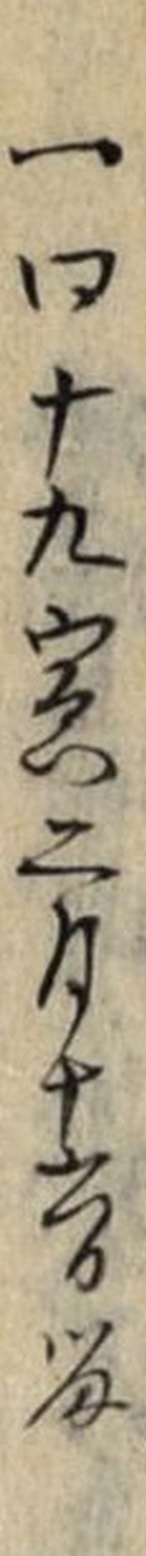一同十九寅二月十六日留
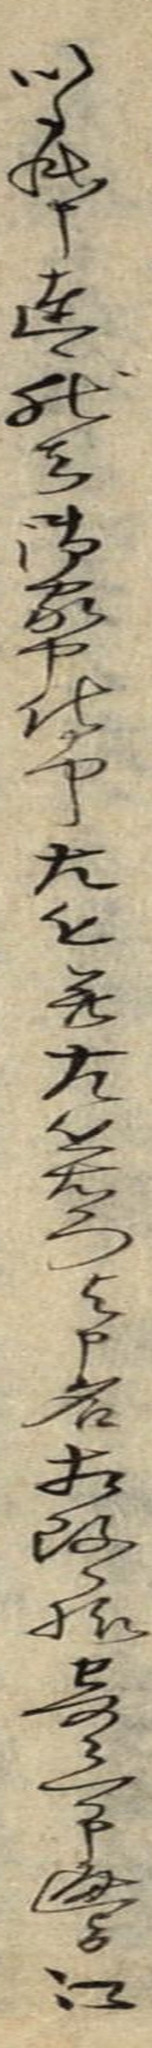以手紙申達候然は御家中侍中左近并左近左衛門と申者相改候様寄々可申通旨江
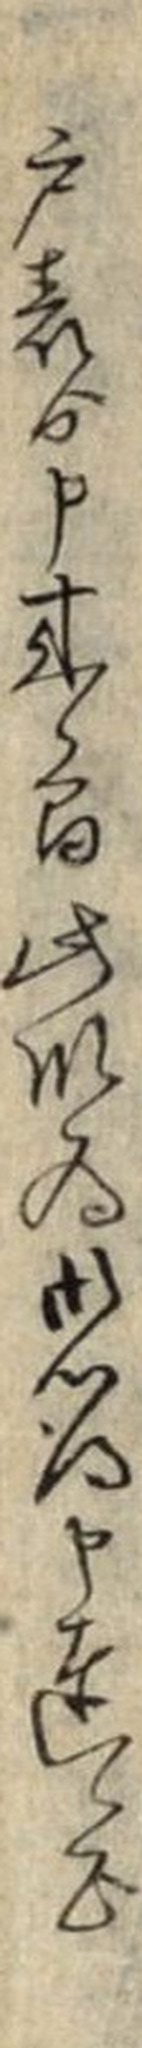戸表ゟ申来候間此段為御心得申達候以上
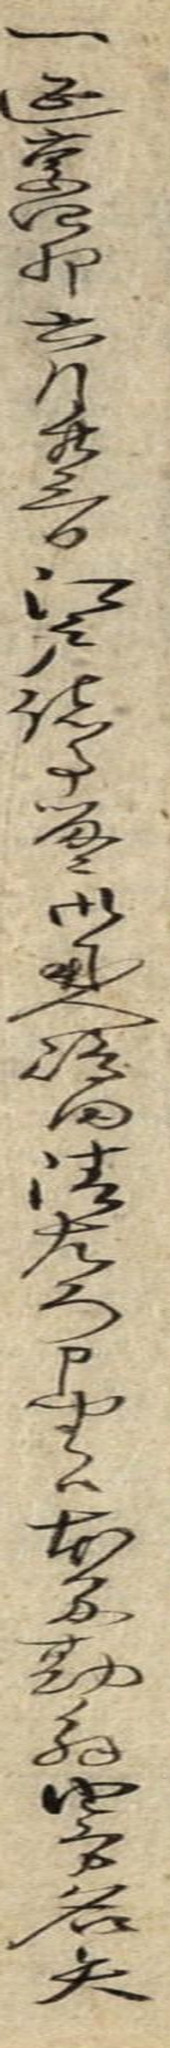一延享四卯六月廿三日江戸諸事留に御用人嶋田清左衛門申聞候は本多勘解由方名矢
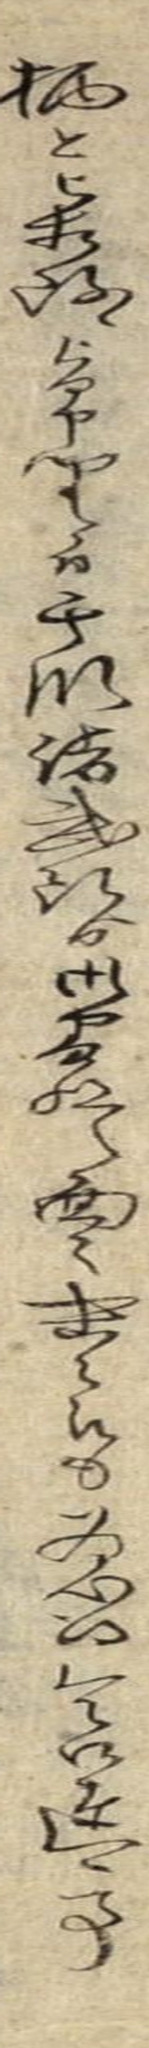柄と被相改候旨申聞候に付其段諸武頭ゟ御番組之面々末々江も為心得令口達候事
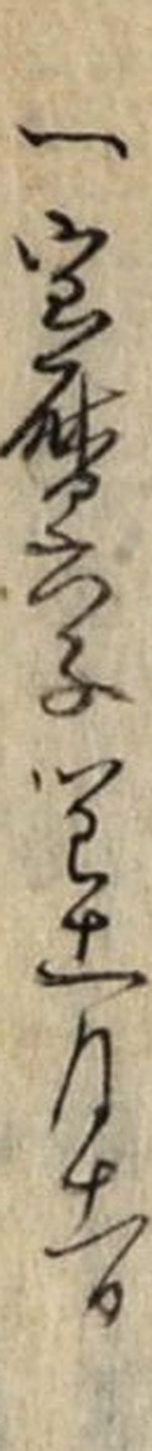一宝暦六子閏十一月十一日
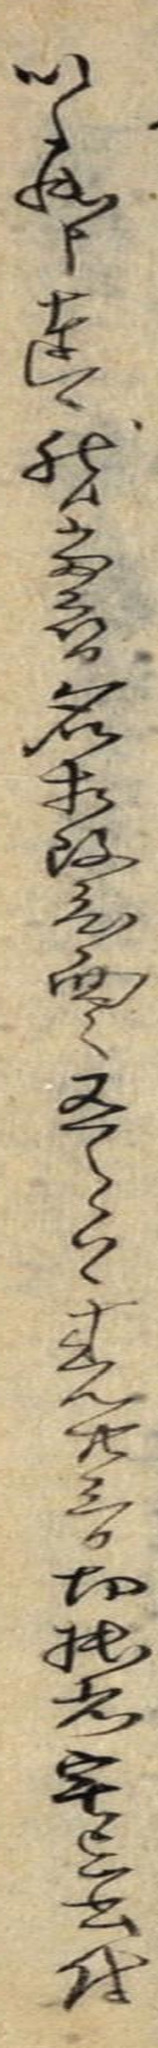以手紙申達候然は当暮名相改度面々有之候はゝ来る廿三日切拙者宅迄書付

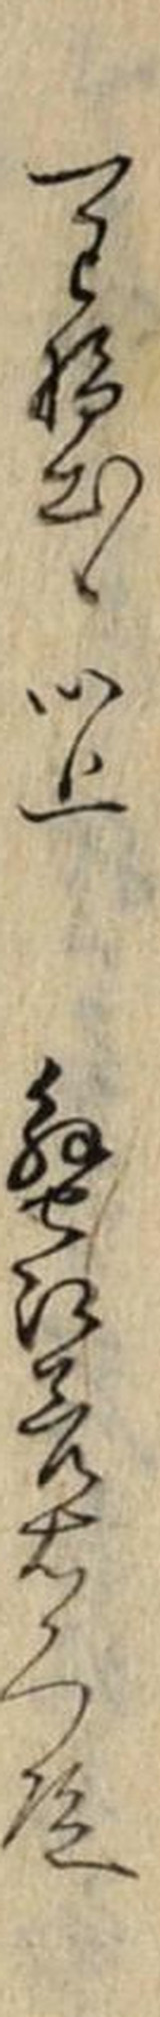可指出候以上蟹江善右衛門殿
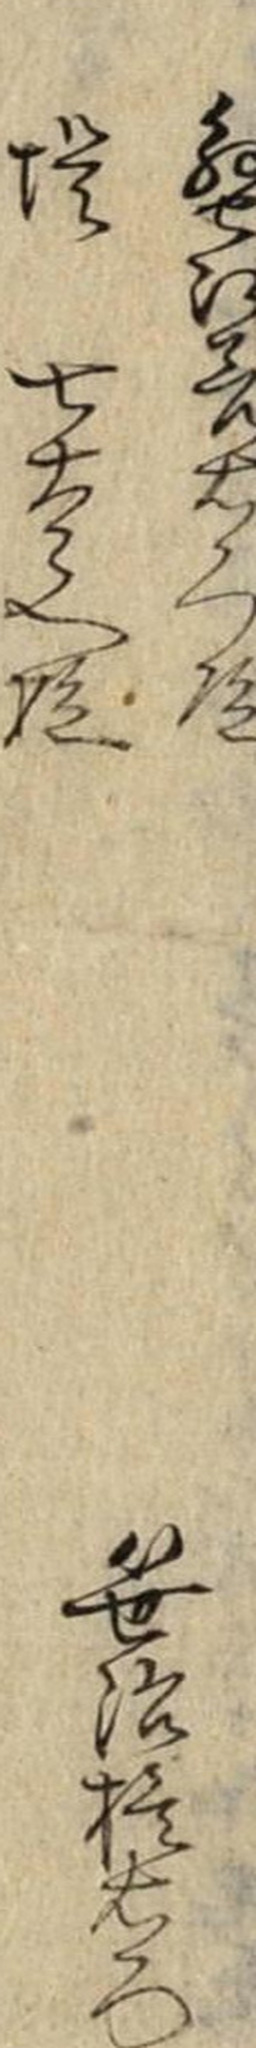堤七太夫殿笹治権右衛門
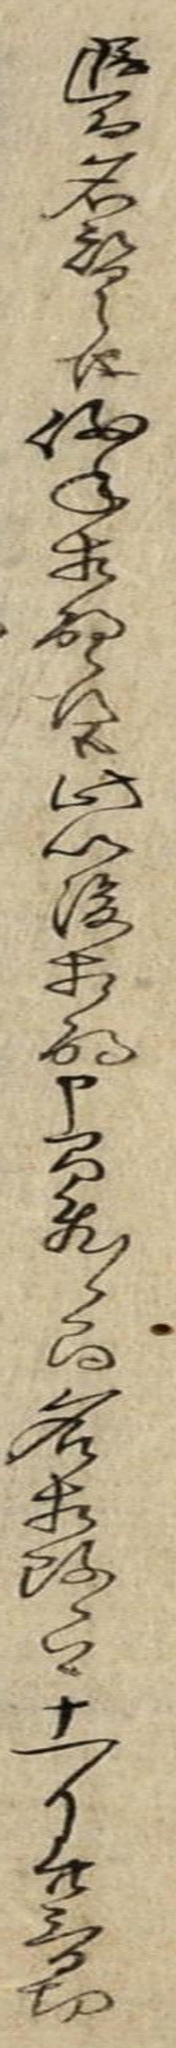追而名替之儀例年相触候得共此以後相触申間敷候間名相改候ハゝ十一月廿三日切
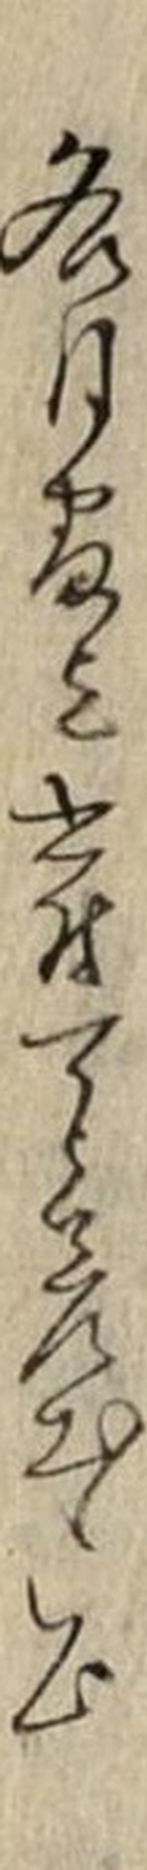各月番迄書付可差出候以上
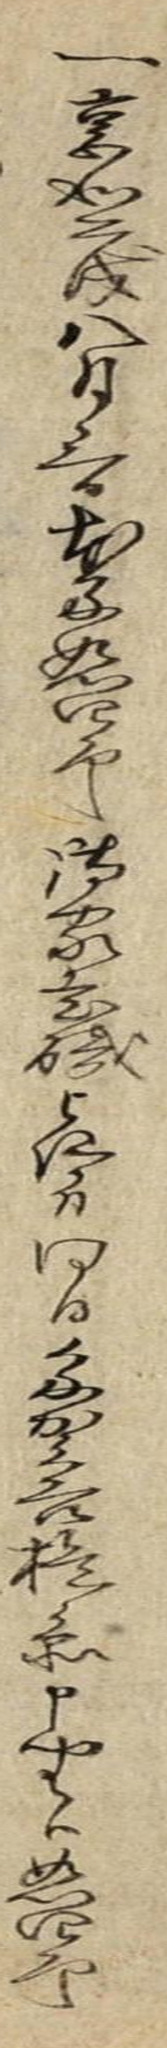一享和二戌八月三日本多恕四郎御家老職被仰付同日多賀谷権兵衛申聞候は恕四郎
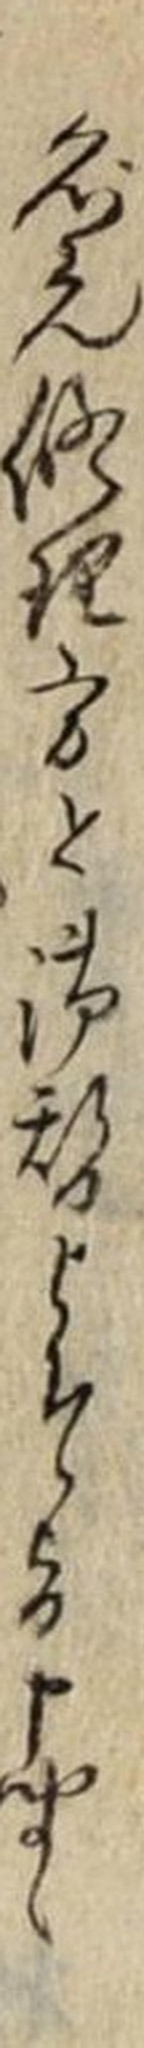名元修理方と御替被下候旨申聞候
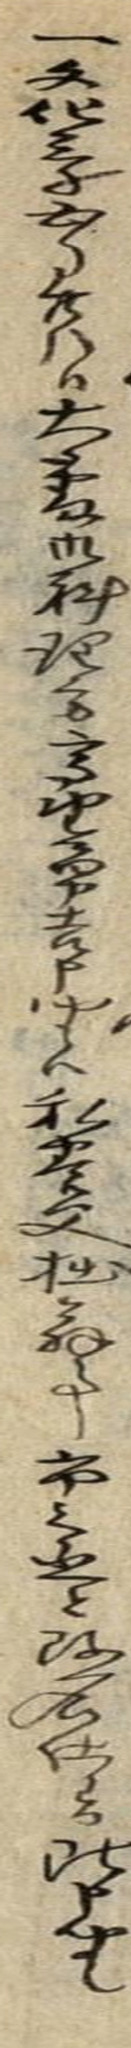一文化三寅五月廿八日大御番御料理方高野勇吉申聞候は私養父拙翁事市之丞と改名仕候に付断申聞候
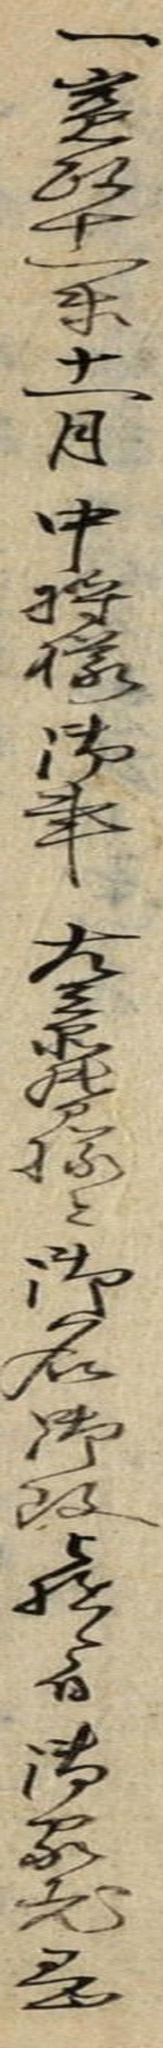一寛政十一未十一月中将様御事左兵衛督様と御名御改被遊候に付御家老岡
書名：蒐輯之部
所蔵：福井県文書館 Fukui Prefectural Archives
